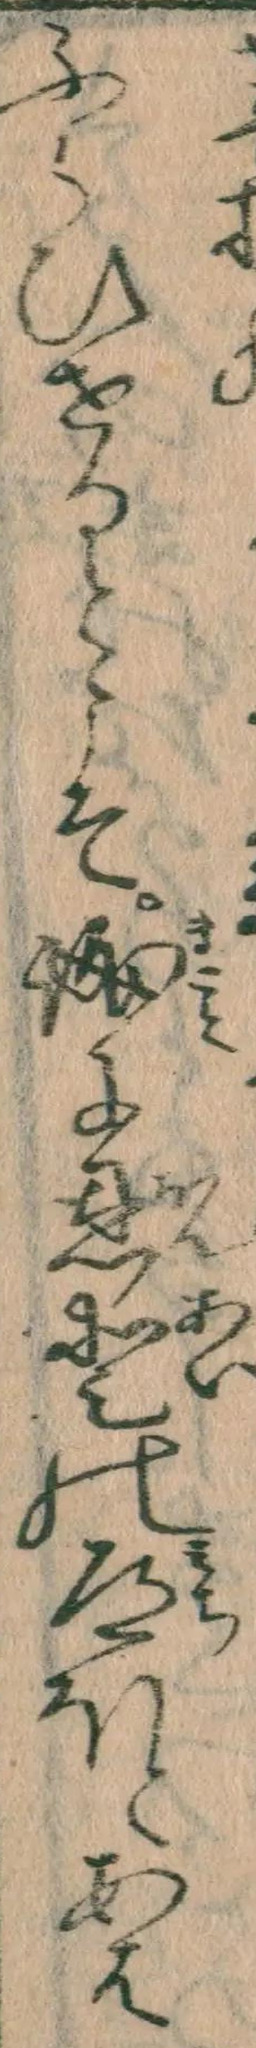ふらひせるとこそ。誠に恩愛の道ほとあは
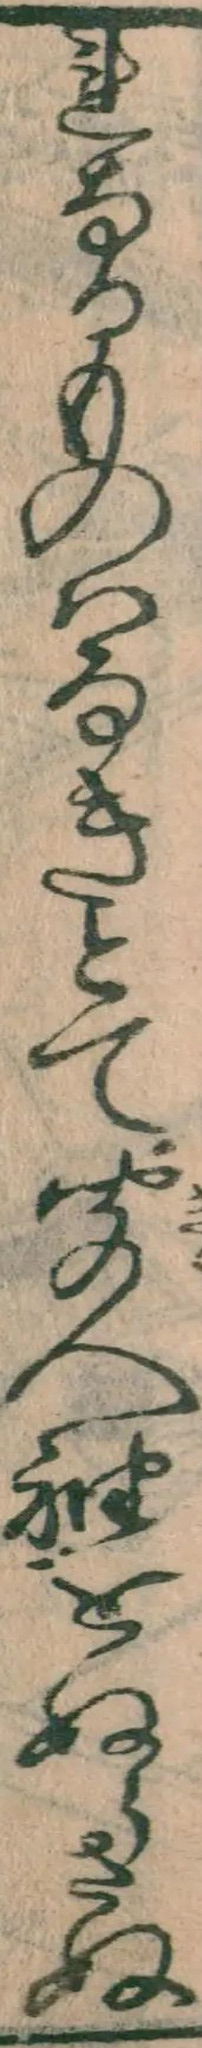れなるものはなきとて、聞人袖をぬらさぬ
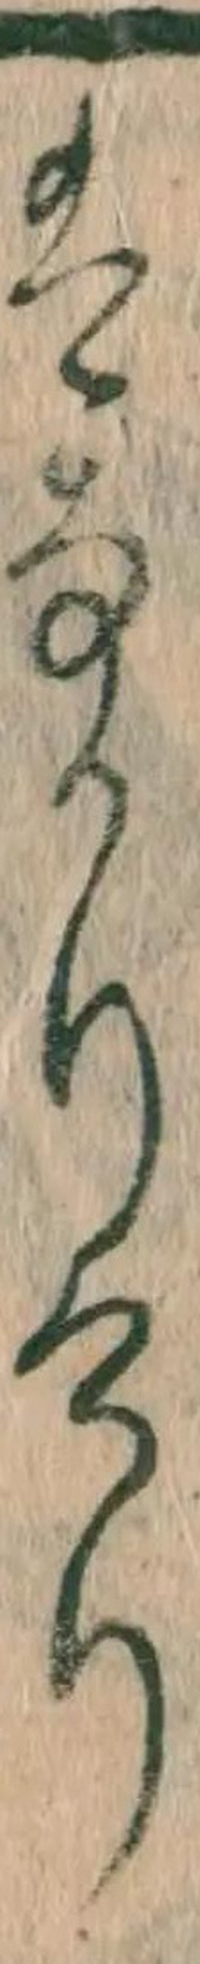はなかりけり
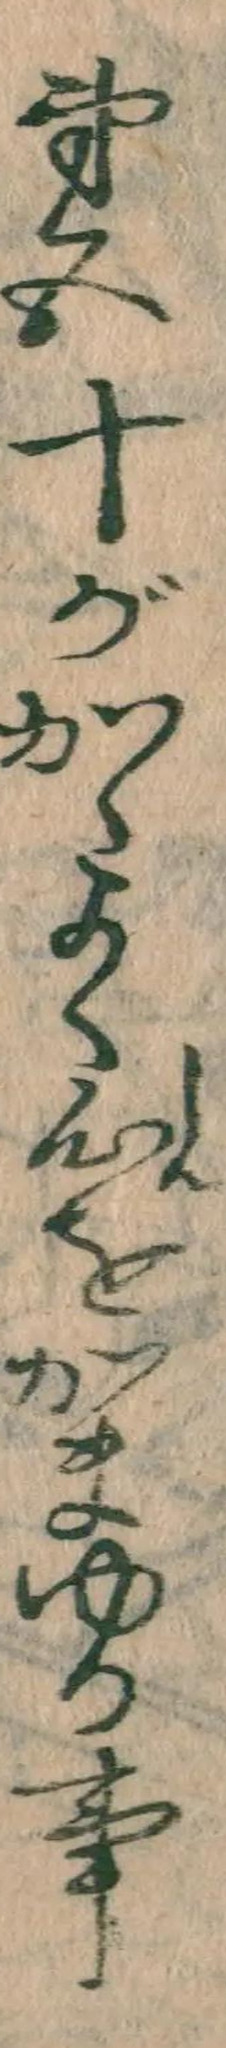第五十がかゝよく心をかまゆる事
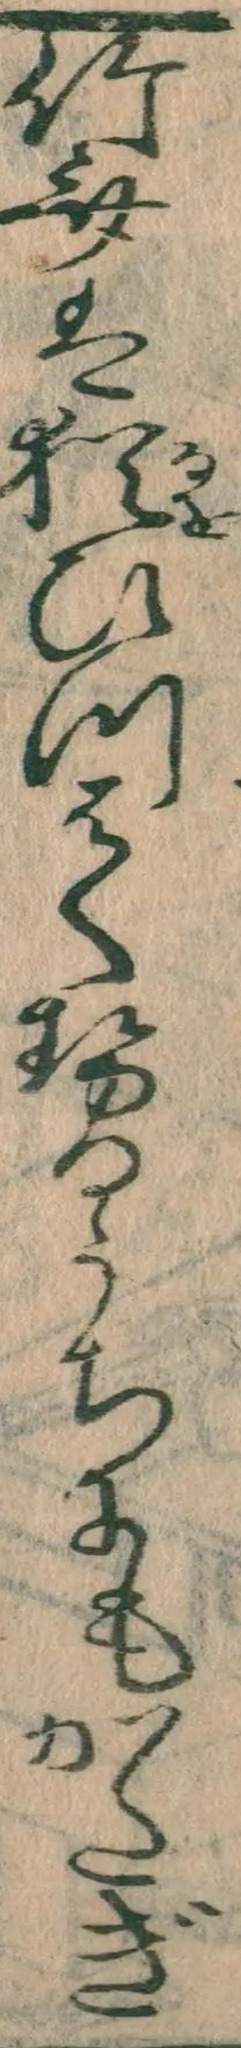竹斎は猶ひつはくせるうちにもかたぎ
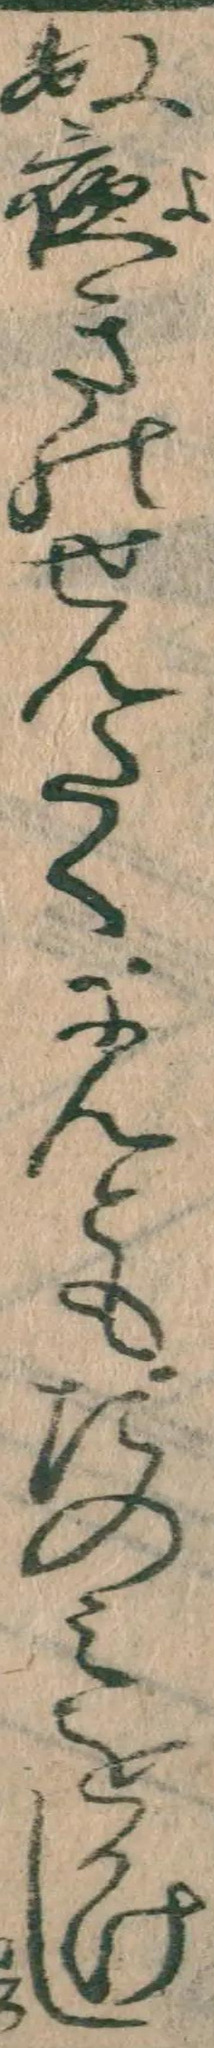ぬ夜きのせんたく、にんとも、たのみをかけし
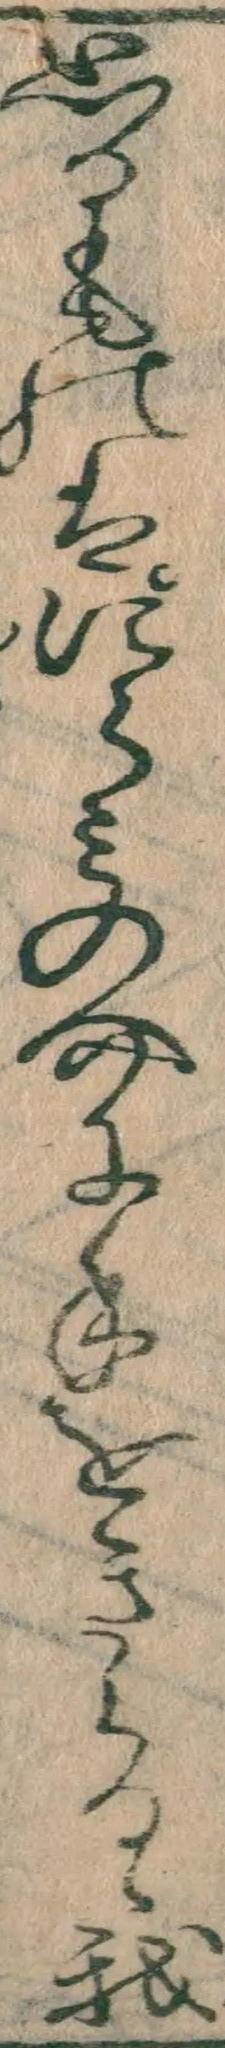思ひものは。にらみの介に手をきらるゝ我
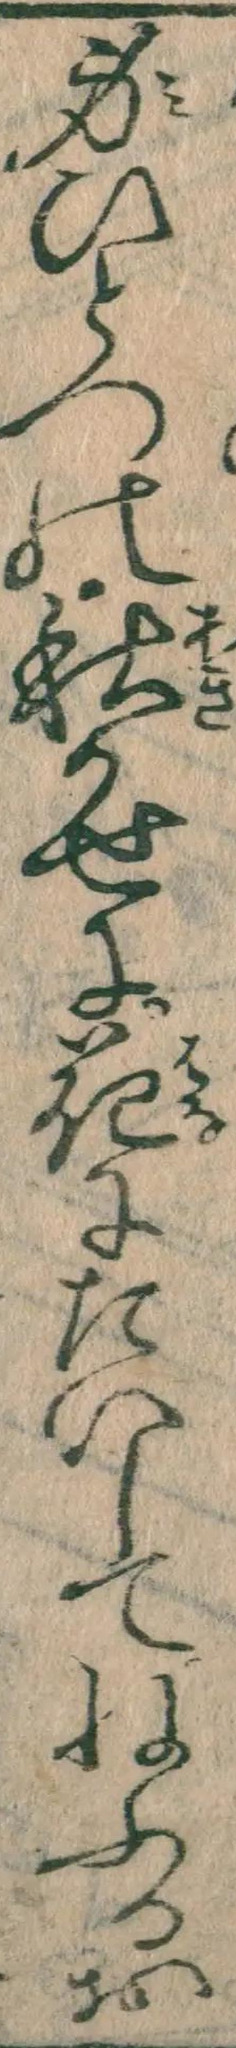身ひとつの、秋かせに。花にたいしてねふるお
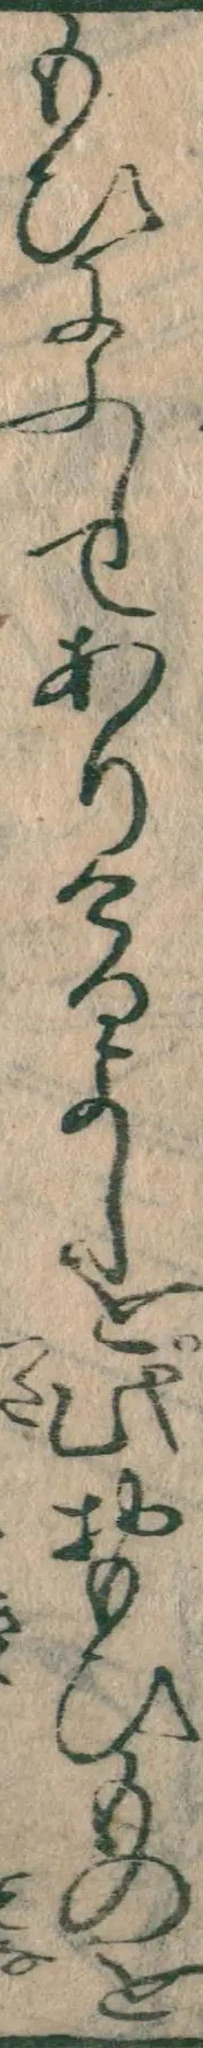もひにふしてありけるよしを。此おもひものを
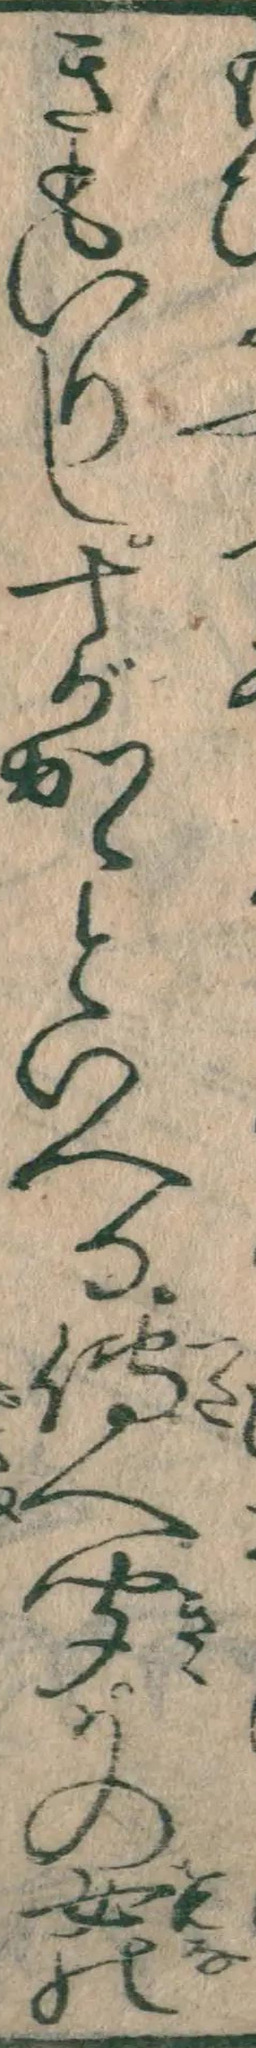きもいりし。十がかゝといへる。伝へ聞。かの女の
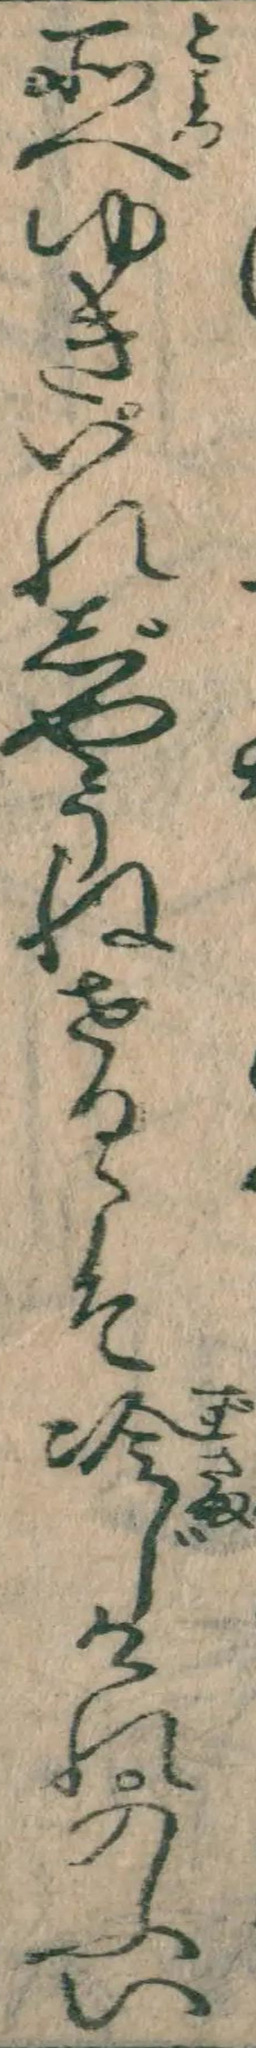所へゆき。いれじやうねせるこそ冷じけれ。のふい

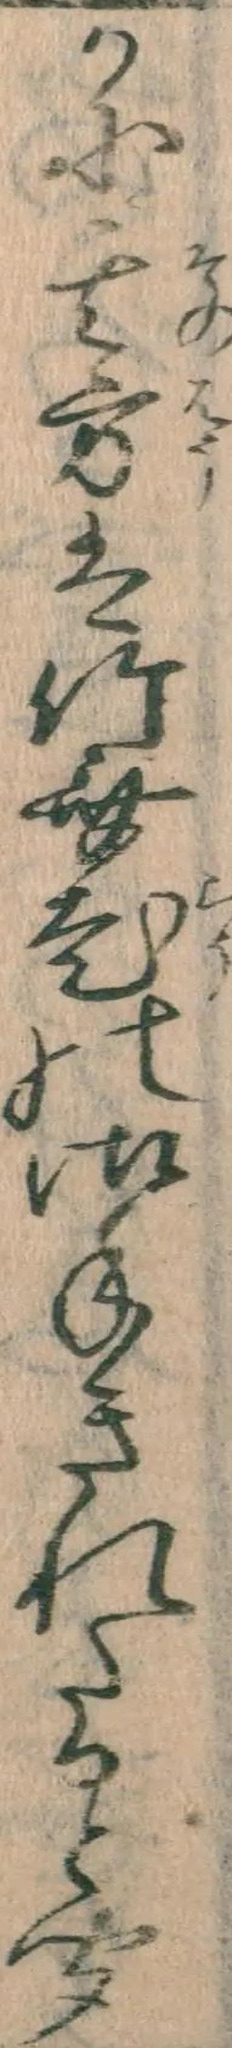かに其方は竹斎老の御手きれたると聞
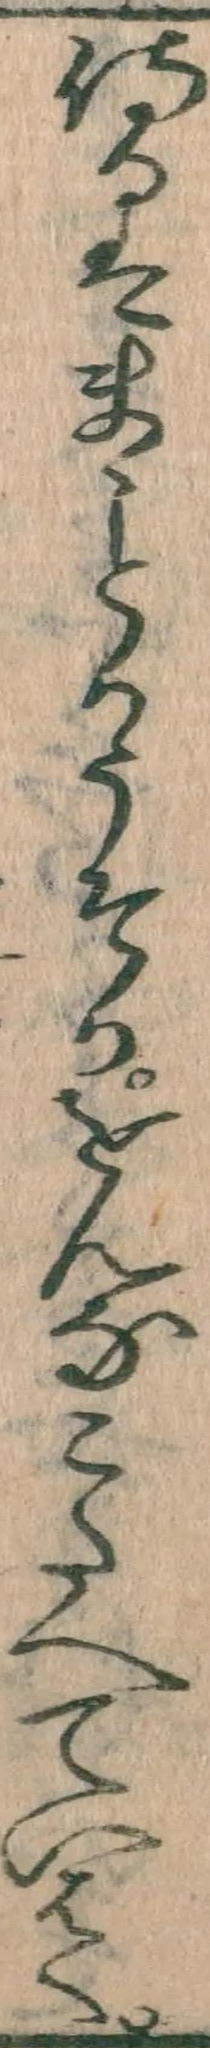侍るはまことかうそか。をんなこたへていはく。
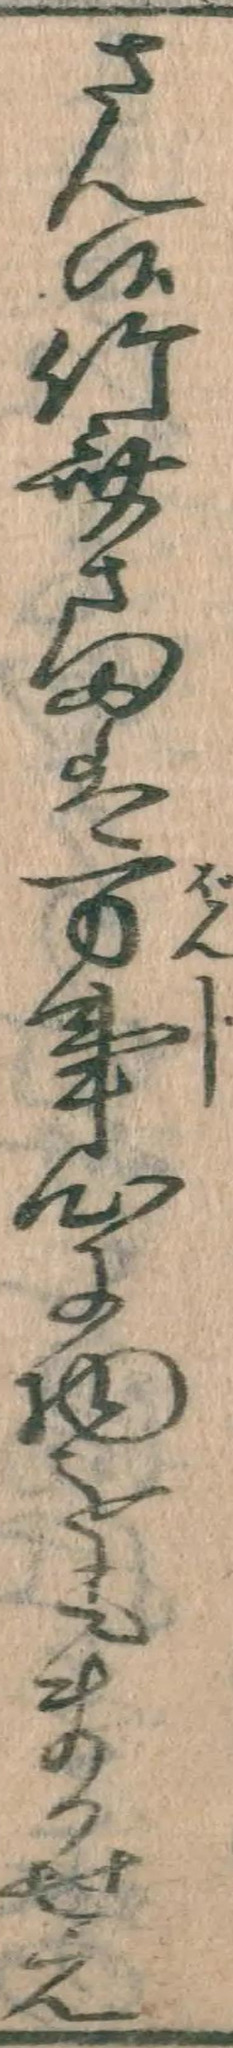さん候竹斎さまは万事心に物をもまかせえ
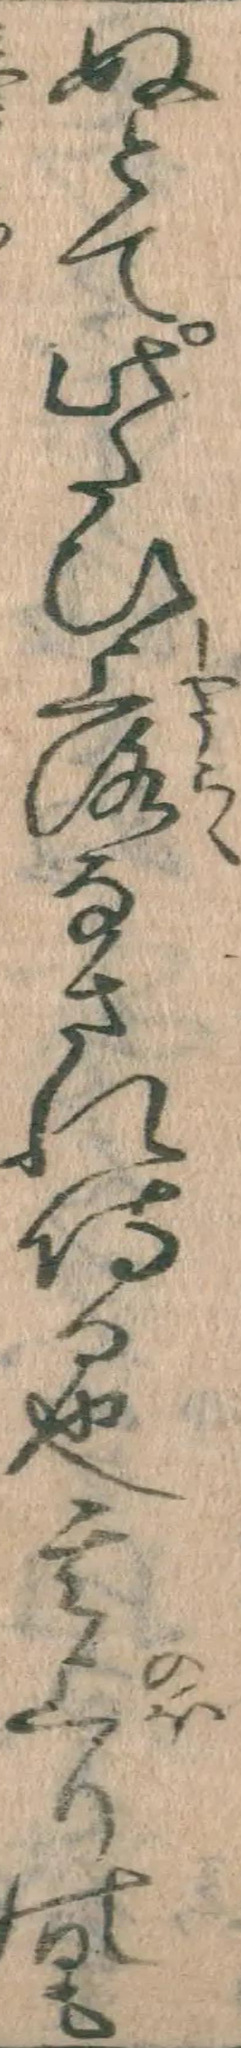ぬとて。此たひ上洛なされ侍る也其上りの日も
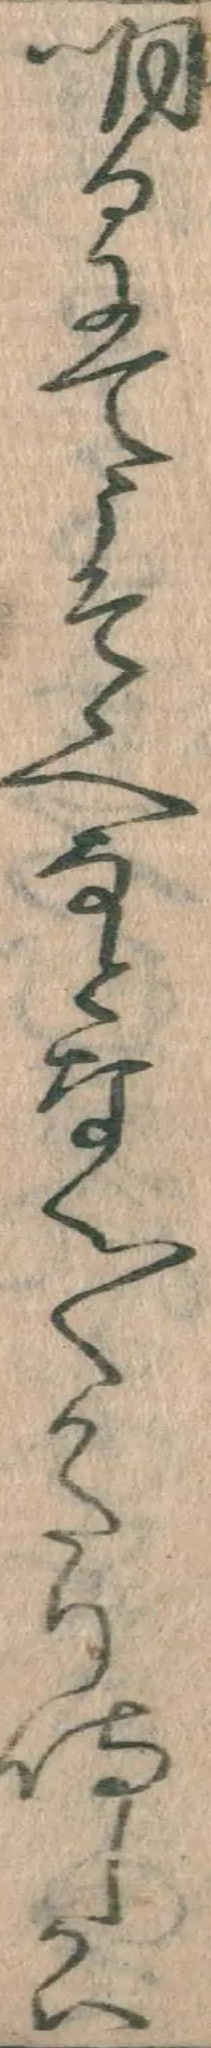明日にてこそ候へなとなく〳〵かたり侍しかは
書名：竹斎狂歌物語 3巻
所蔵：国立国会図書館 National Diet Library, JAPAN
